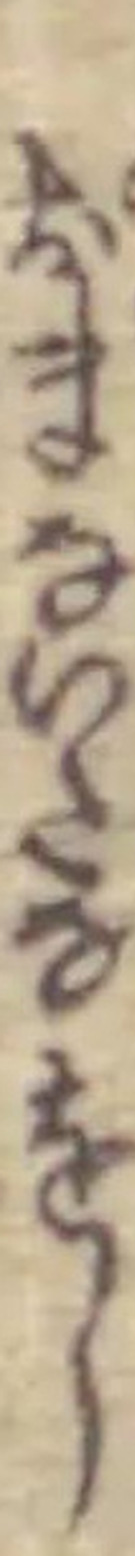おまないたなをし
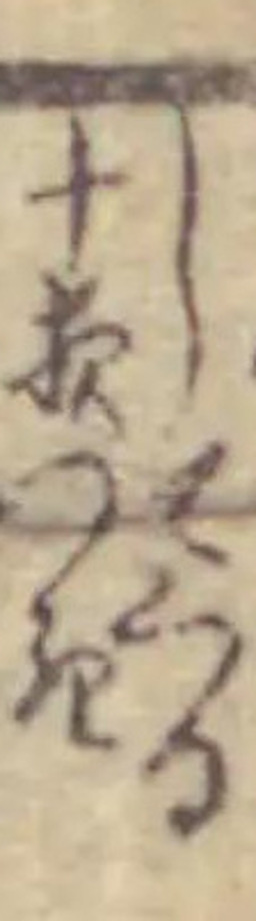十夜つき
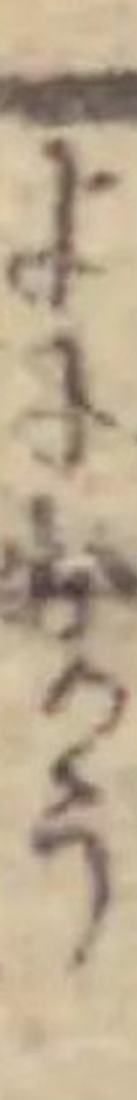よにおかう
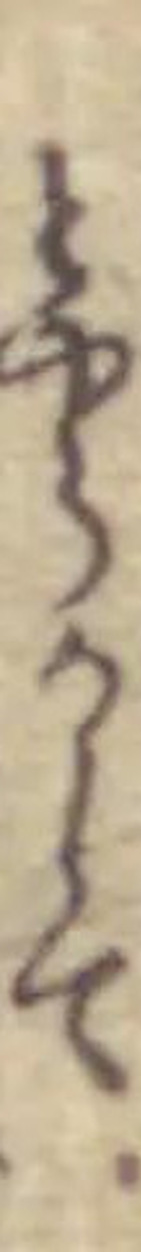とやらかして
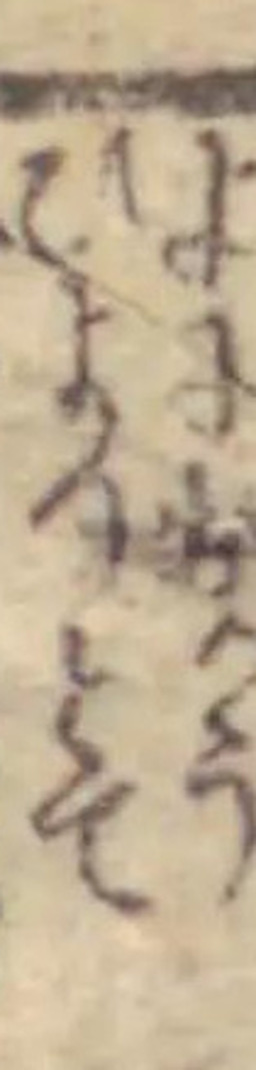ひよりとて
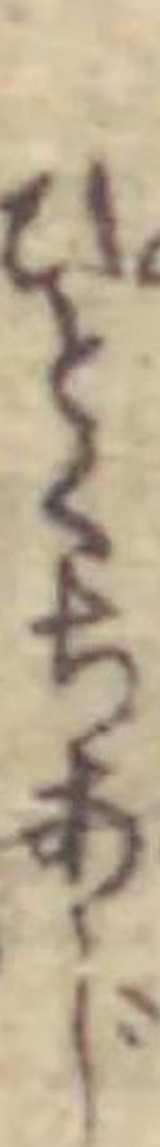ひとくちあじ
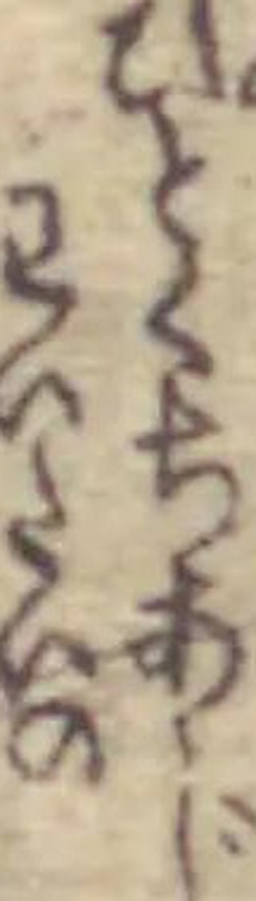わいたいの
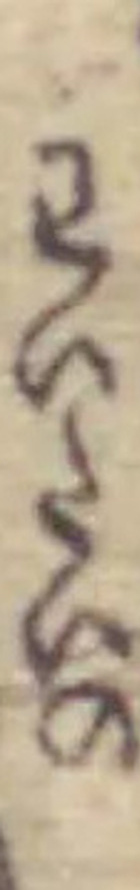わいたいの
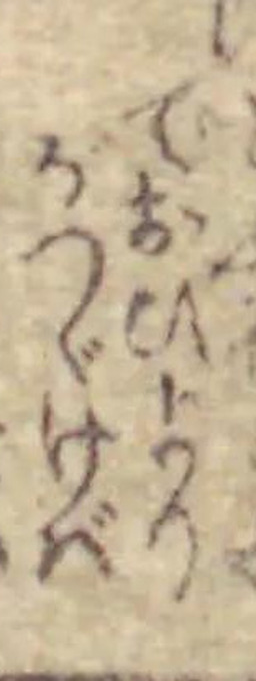がつゞけば
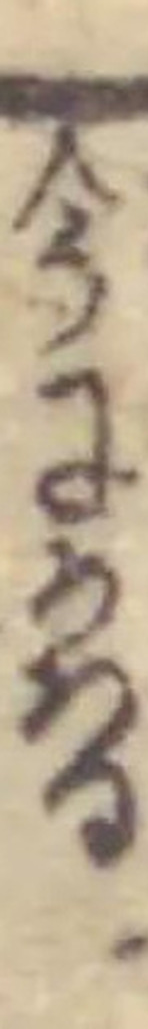今にかはる
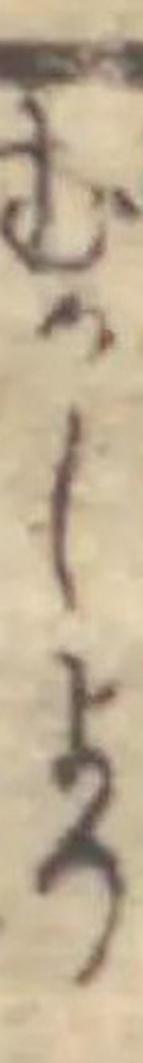むかしより
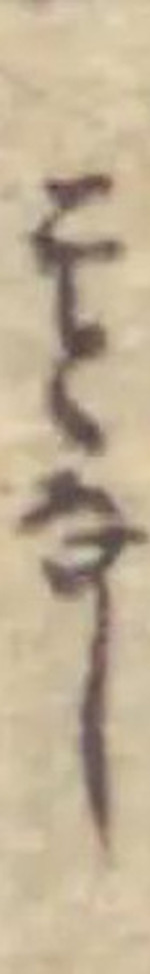ことなし
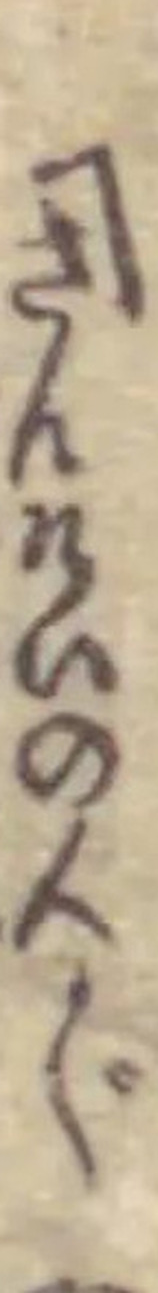〽さんけいの人〴〵
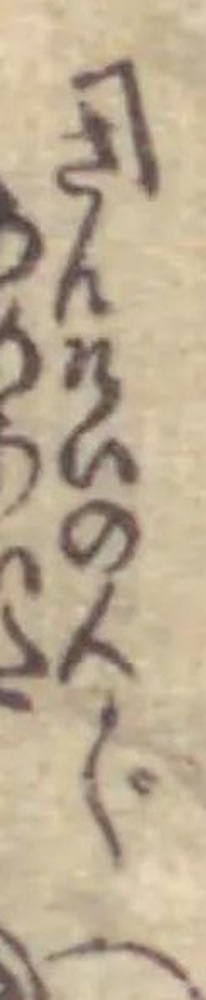〽さんけいの人〴〵
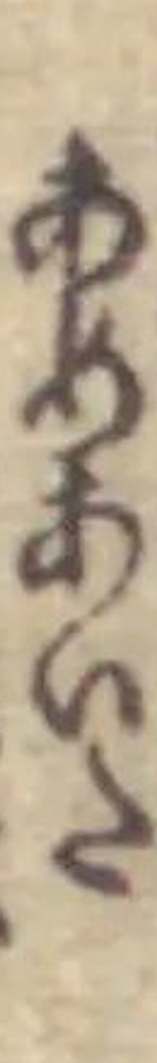あめあいた
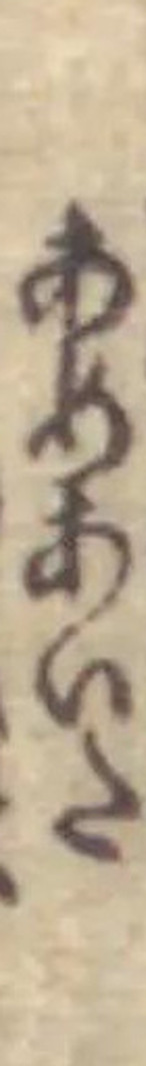あめあいた
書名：雨宮風宮出儘略縁記 3巻
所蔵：国立国会図書館 National Diet Library, JAPAN
